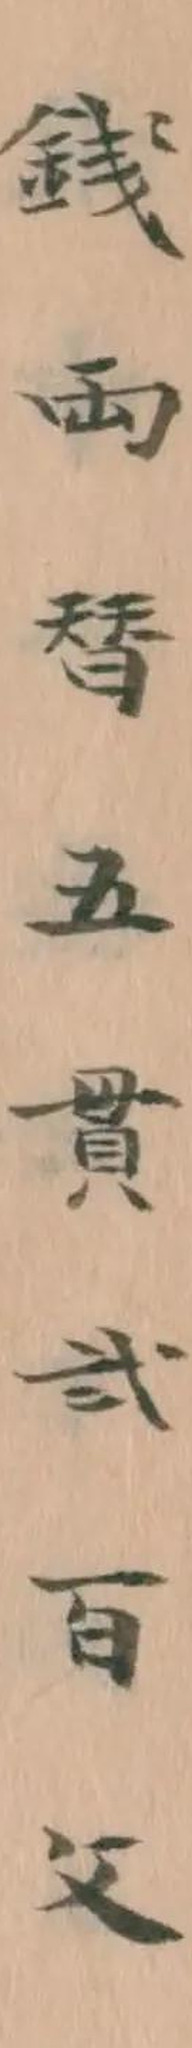銭両替五貫弐百文
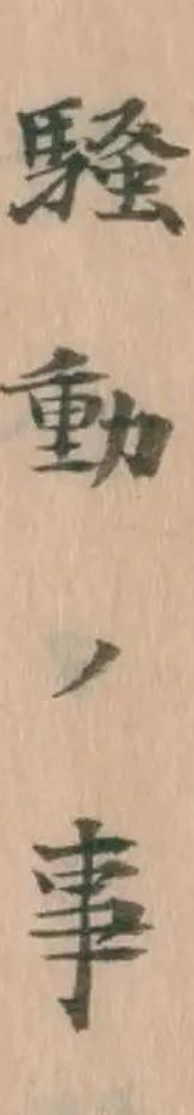騒動ノ事
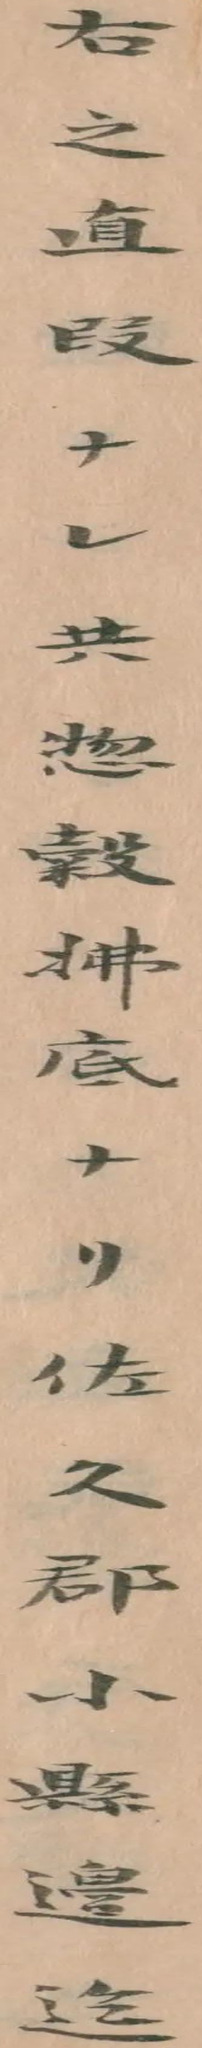右ノ直段ナレ共惣穀払底ナリ佐久郡小県辺迄
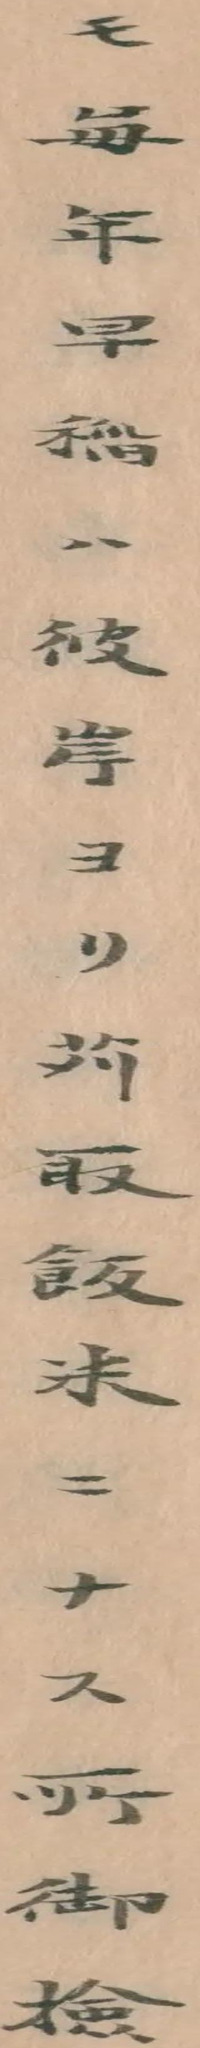モ毎年早稲ハ彼岸ヨリ苅取飯米二ナス所御検
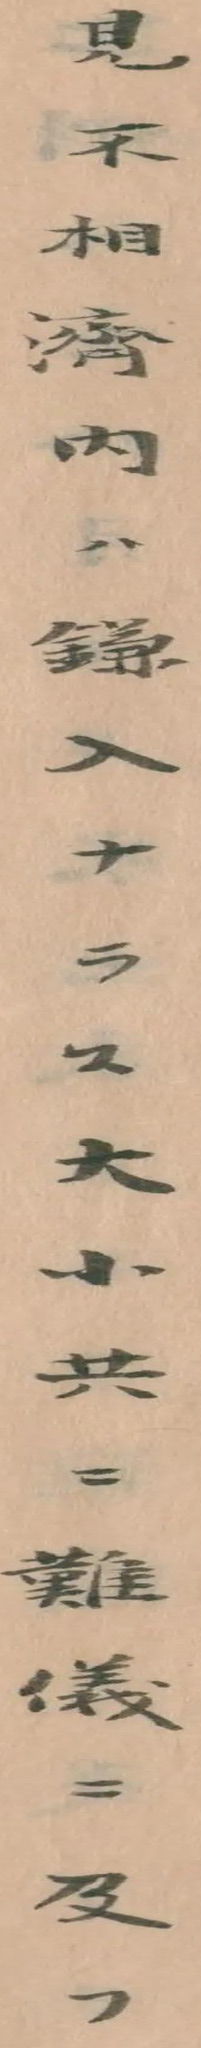見不相済内破鎌入ナラス大小共二難儀二及フ

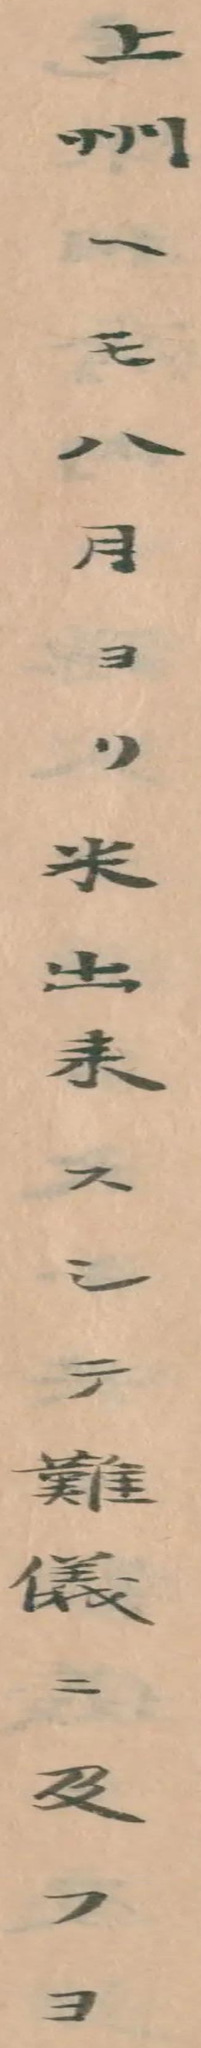上州ヘモ八月ヨリ米出来スシテ難儀二及フヨ
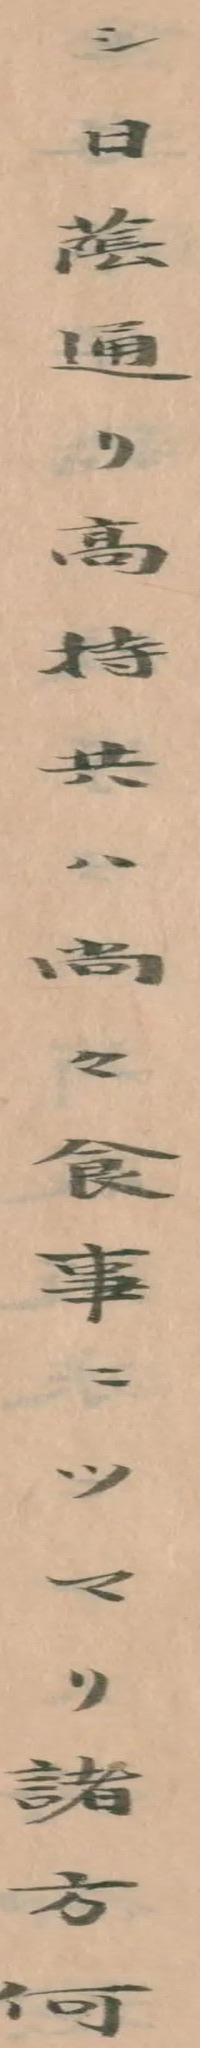シ日蔭通り高持共ハ尚々食事二ツマリ諸方何
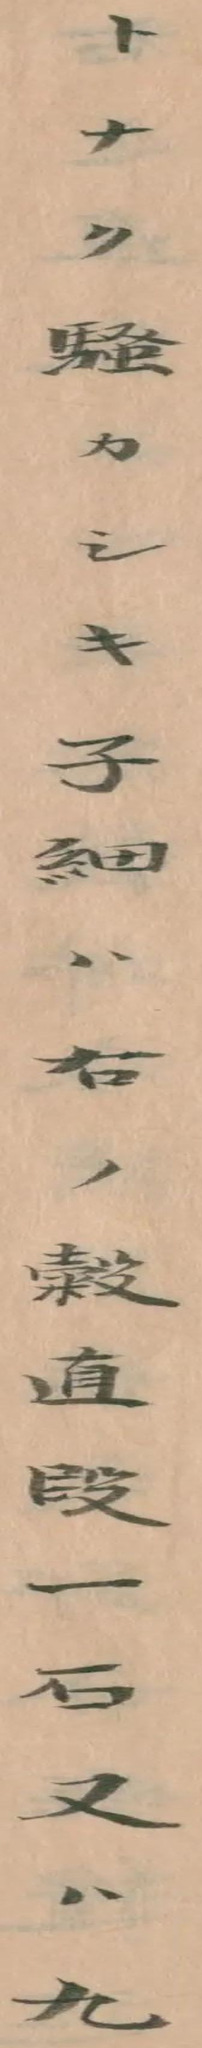トナク騒カシキ子細ハ右ノ穀直段一石又ハ九
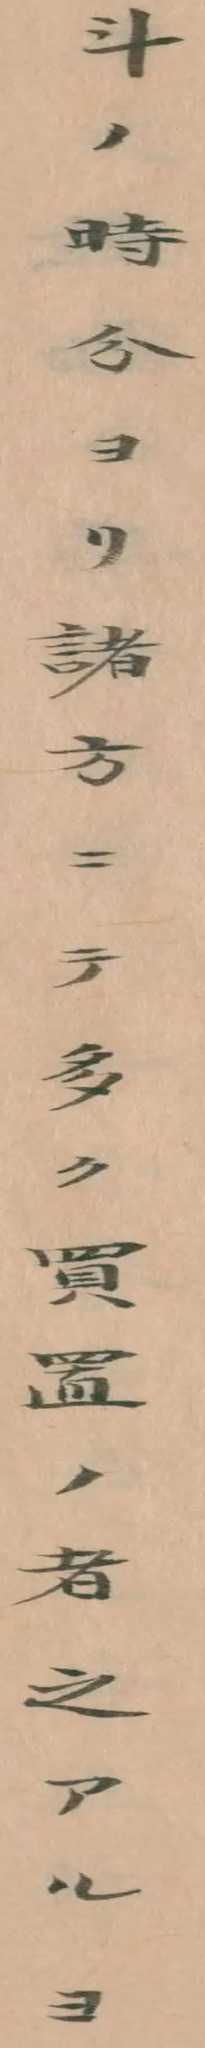斗ノ時分ヨリ諸方ニテ多ク買置ノ者之アルヨ
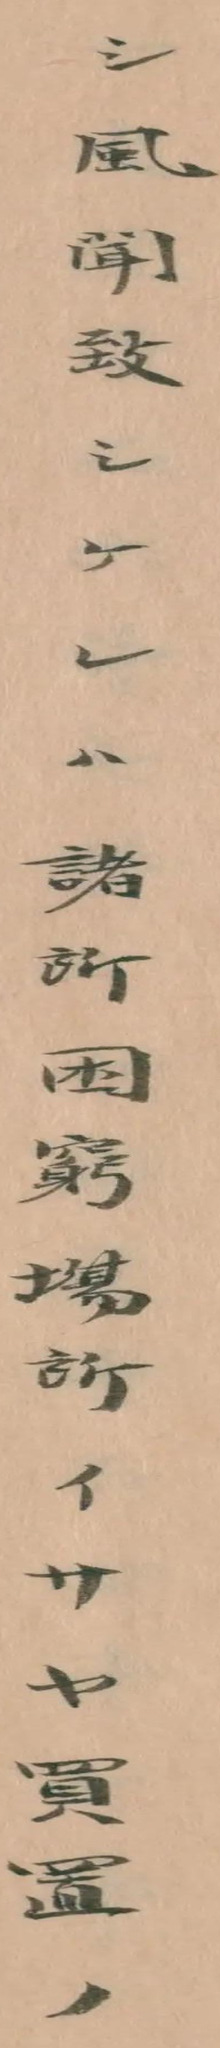シ風聞致シケレハ諸所困窮場所イサヤ買置ノ
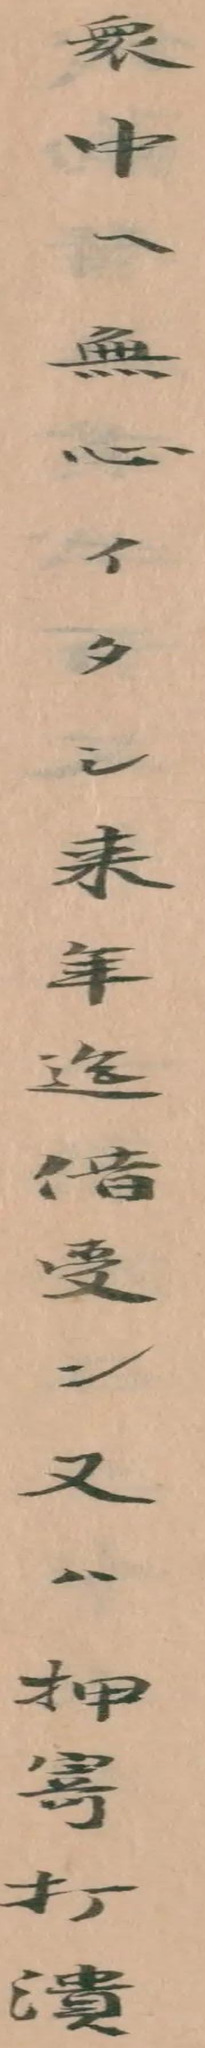衆中へ無心イタシ来年迄借受ン又ハ押寄打潰
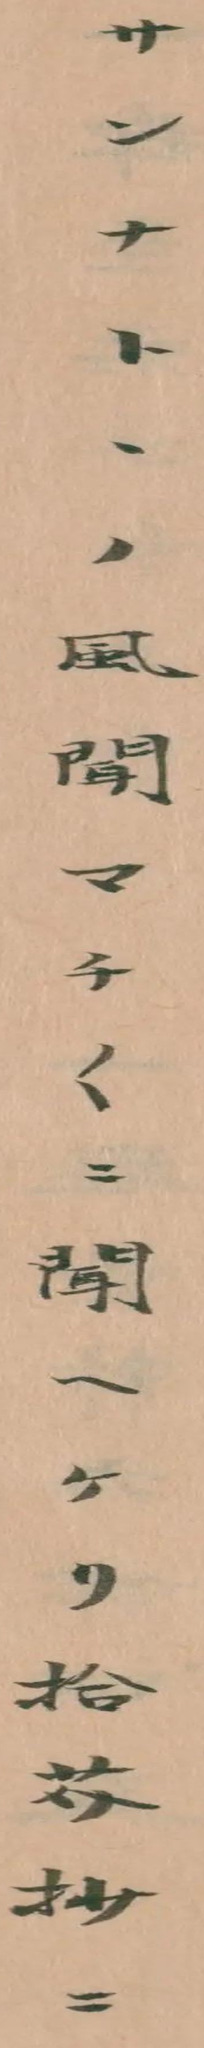サンナトゝノ風聞マチ〳〵二聞へケリ拾芥抄二
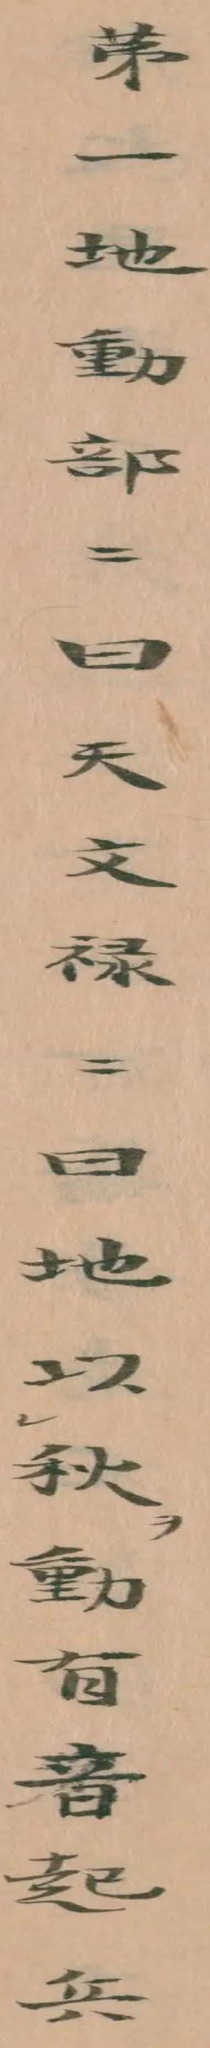第一地動部二曰天文禄二曰地以秋動有音起兵
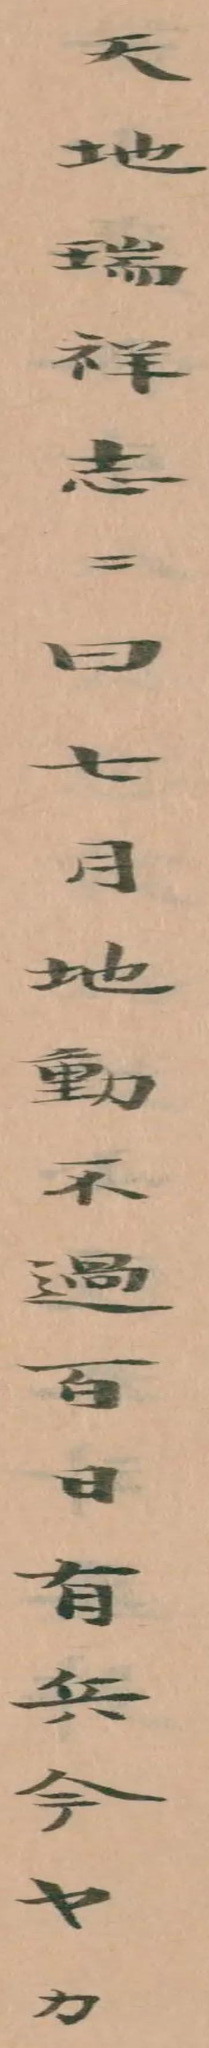天地瑞祥志二曰七月地動不過百日有兵今ヤカ
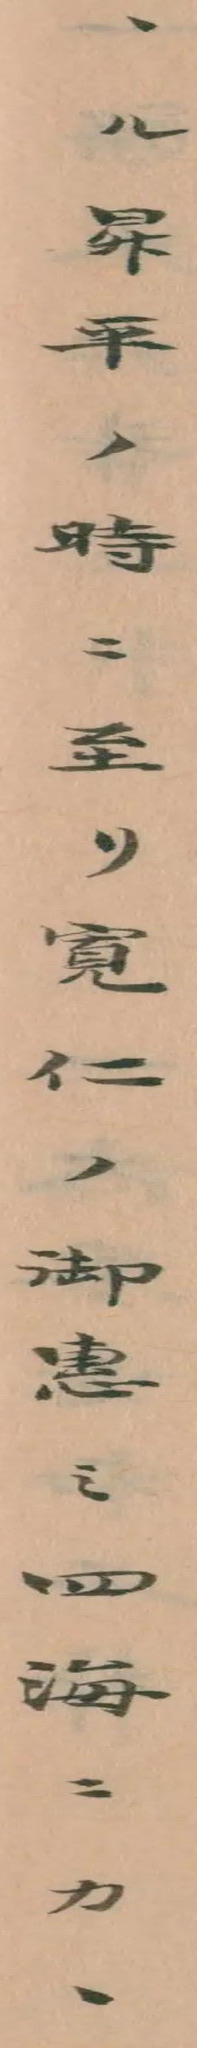ゝル昇平ノ時二至り寛仁ノ御恵ミ四海二カゝ
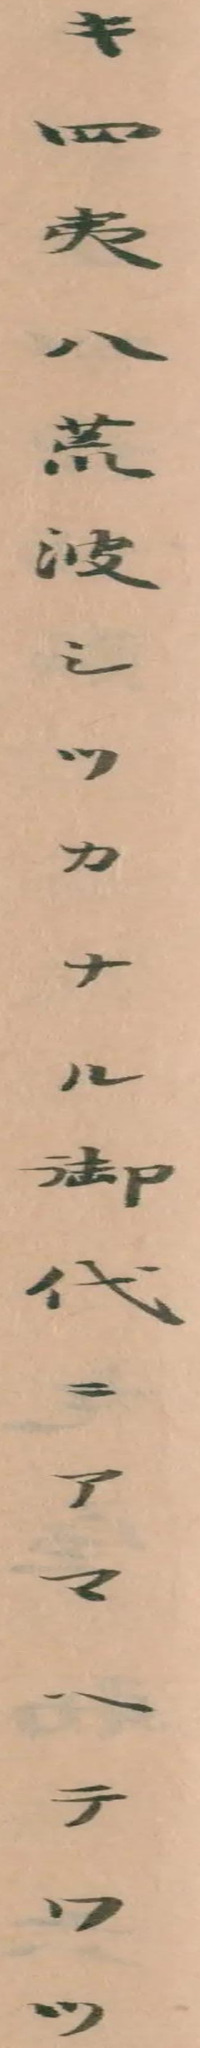キ四夷八荒波シツカナル御代二アマへテワツ
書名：地災撮要. 巻3(地震之部)-巻4(噴火之部)
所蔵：国立国会図書館 National Diet Library, JAPAN
